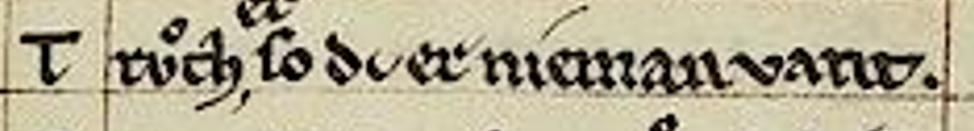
Trv°och °(er) ſo d(az) er nieman vant.
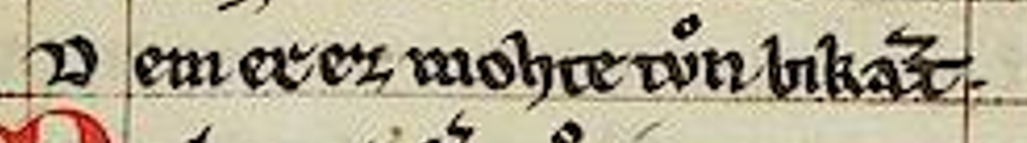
Dem er ez mohte tv°on bika(n)t.
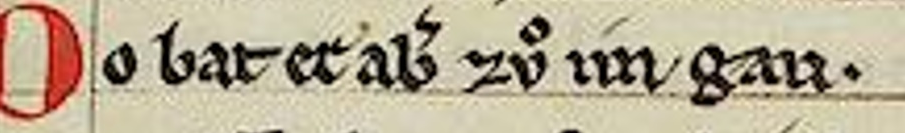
*Do bat er ab(er) zv°o im gan.
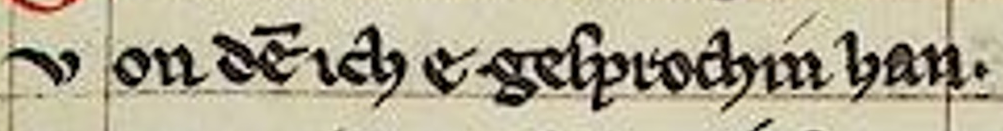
Von de(m) ich e geſprochin han.
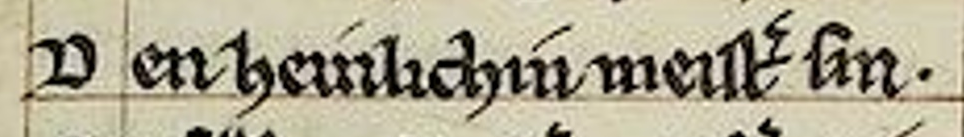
Den heinlichin meiſt(er) ſin.
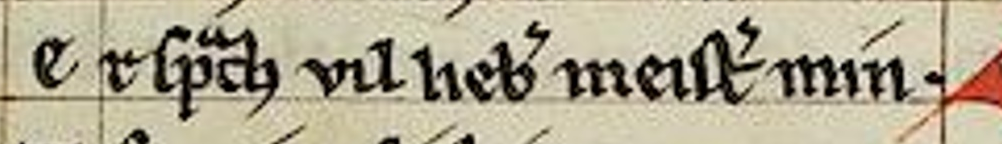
Er ſp(ra)ch vil lieb(er) meiſt(er) min.
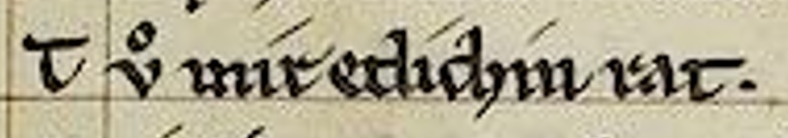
Tv°o mir etlichin rat.
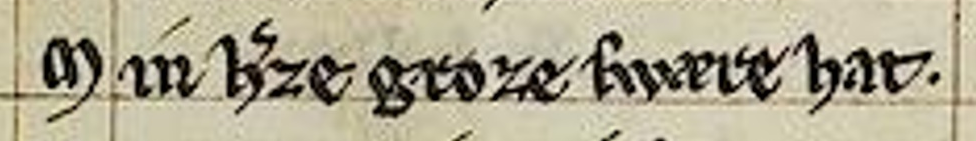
Min h(er)ze groze ſw[ae]re hat.
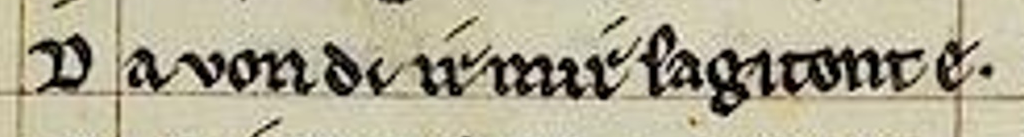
Da von d(az) ir mir ſagitont e.
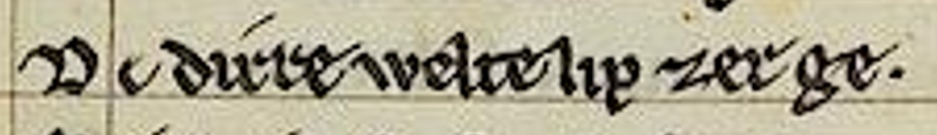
D(az) dirre welte lip zer ge.
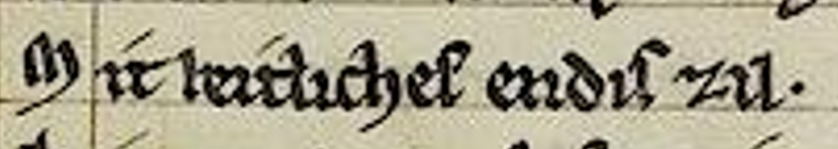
Mit leitlicheſ endiſ zil.
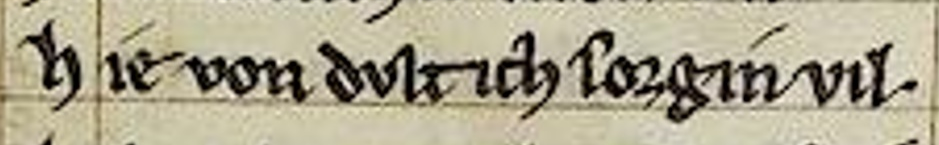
Hie von dvlt ich ſorgin vil.
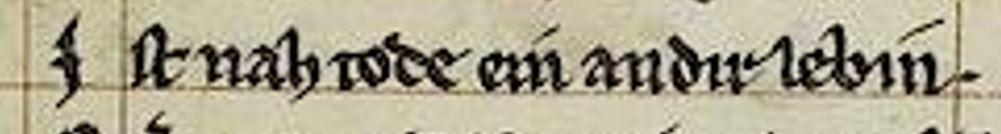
Iſt nah tode ein andir lebin.
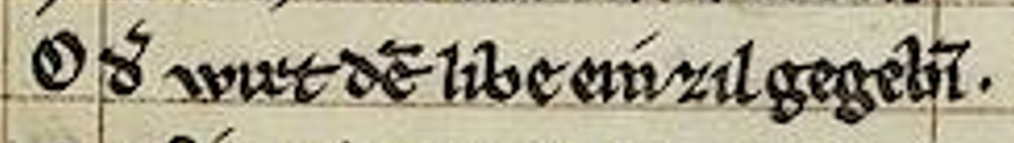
Od(er) wirt de(m) libe ein zil gegebi(n).
